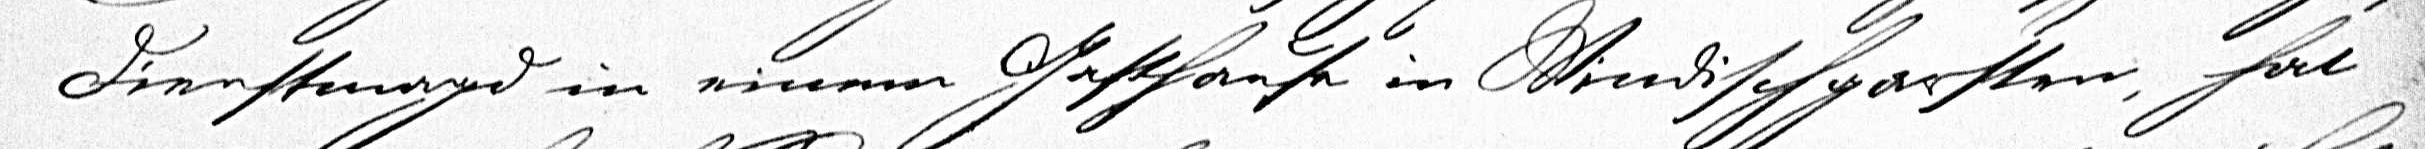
Dienstmagd in einem Gasthause in Windischgarsten, hat
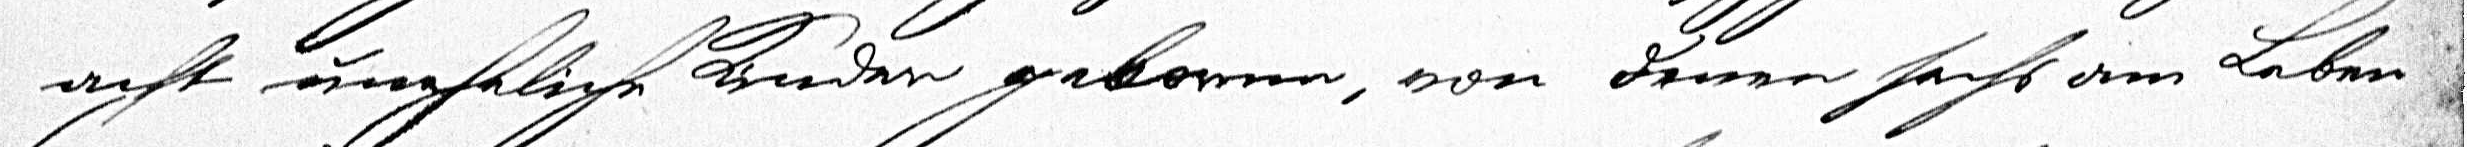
acht uneheliche Kinder geboren, von denen sechs am Leben
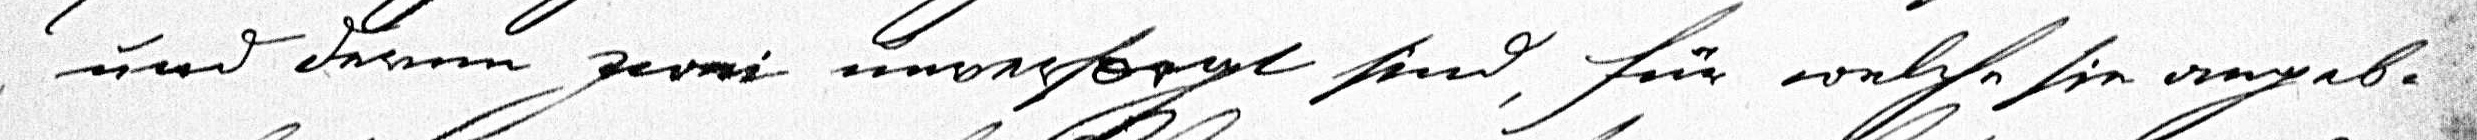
und deren zwei unversorgt sind, für welche sie angeb¬
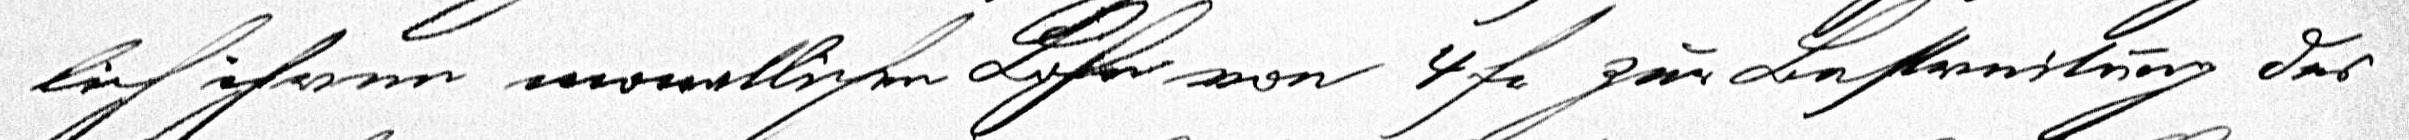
lich ihren monatliche Lohn von 4f zur Bestreitung des
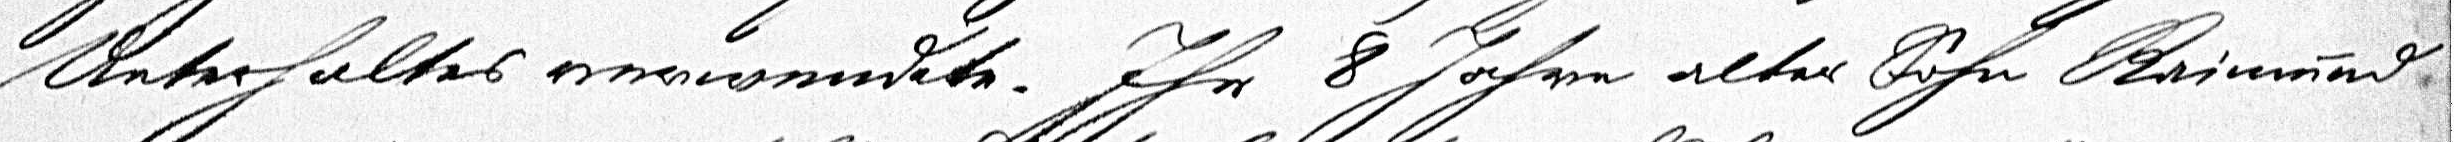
Unterhaltes verwendete. Ihr 8 Jahre alter Sohn Raimund
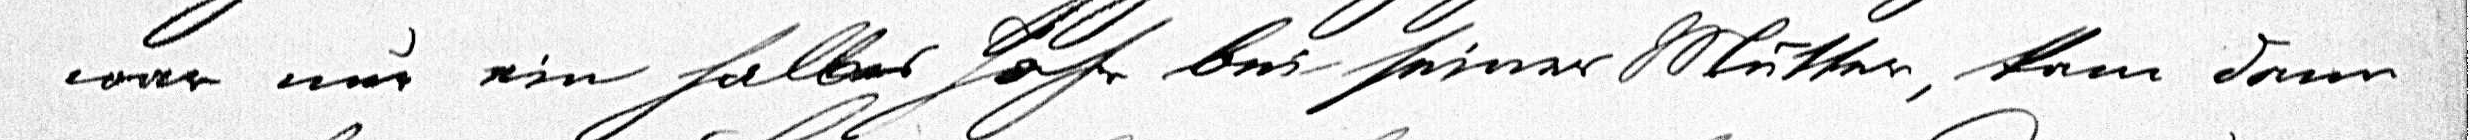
war nur ein halbes Jahr bei seiner Mutter, kam dann
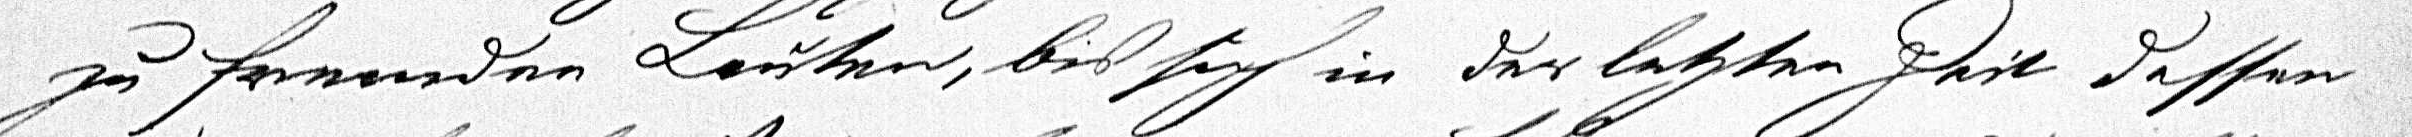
zu fremden Leuten, bis sich in der letzten Zeit dessen
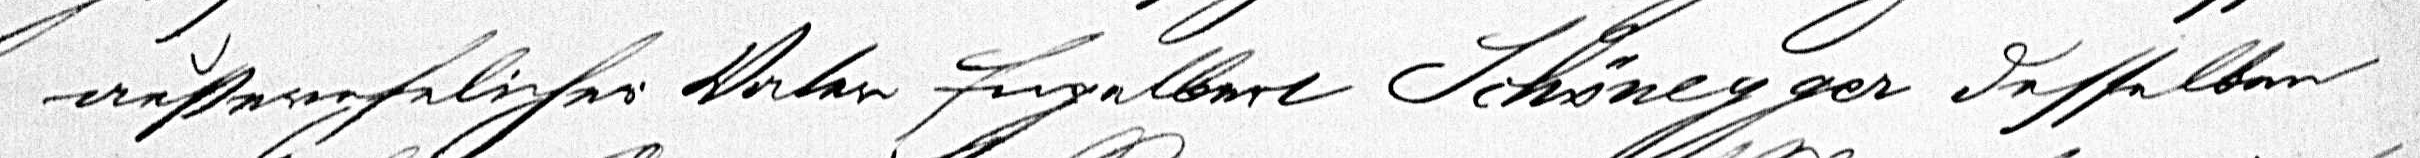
außerehelicher Vater Engelbert Schönegger desselben
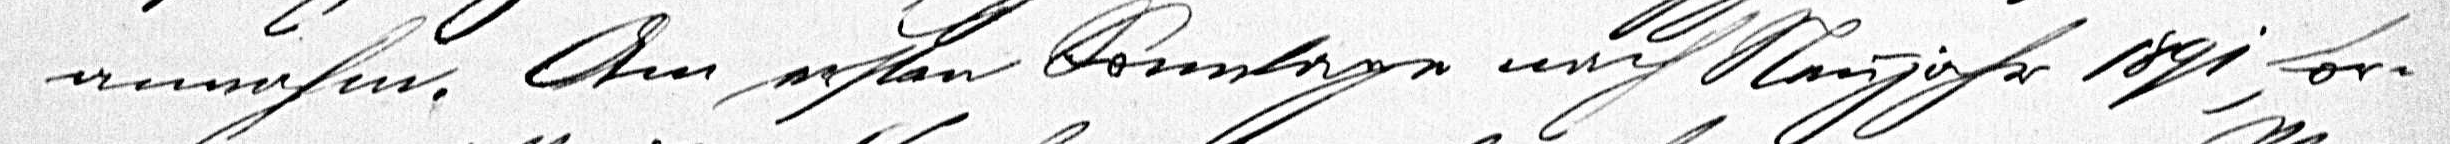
annahm. Am ersten Sonntage nach Neujahr 1891 for¬
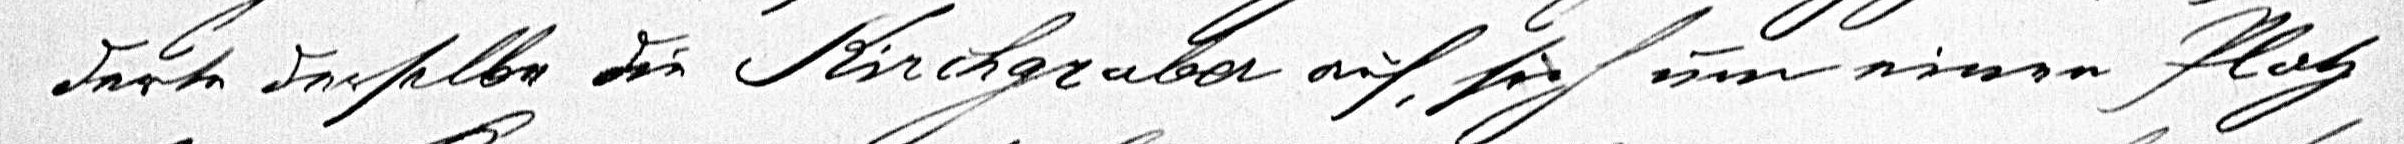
derte derselbe die Kirchgraber auf, sich um einen Platz
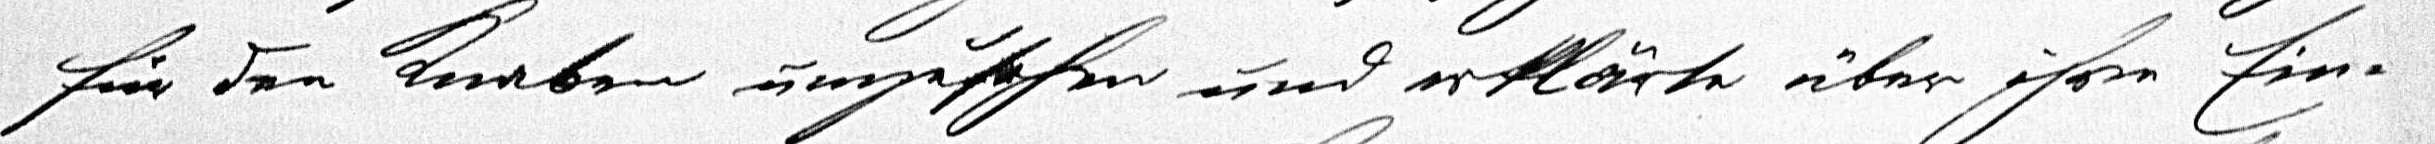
für den Knaben umzusehen und erklärte über ihre Ein¬
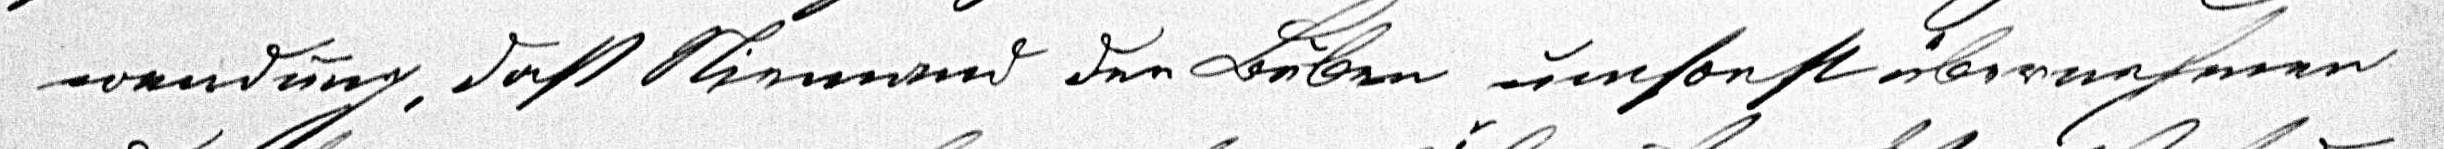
wendung, daß Niemand den Buben umsonst übernehmen
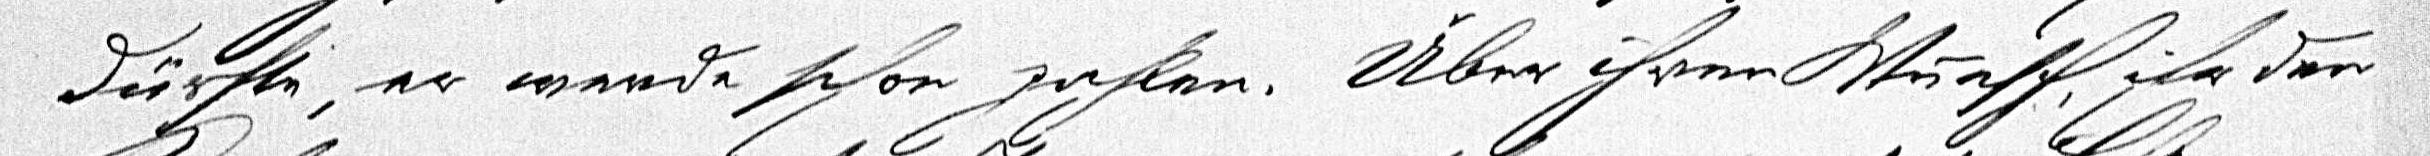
dürfte, er werde schon zahlen. Über ihren Wunsch, ihr den
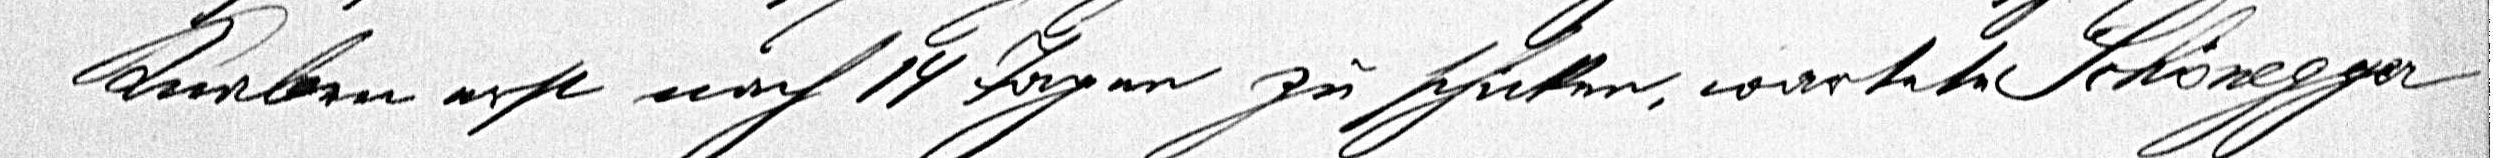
Knaben erst nach 14 Tagen zu schicken, wartete Schönegger
